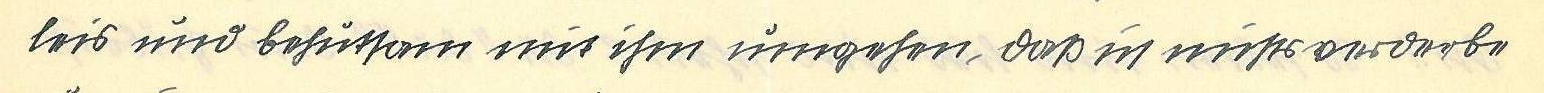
leis und behutsam mit ihm umgehen, daß ich nichts verderbe
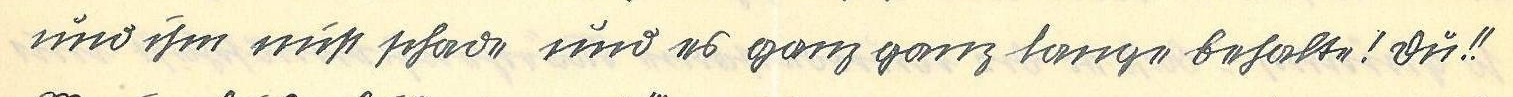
und ihm nicht schade und es ganz ganz lange behalte! Du!!
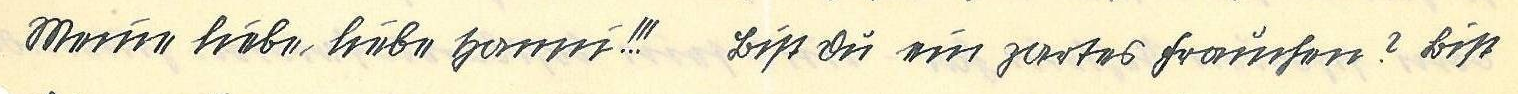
Meine liebe, liebe!! Bist Du ein zartes Frauchen? Bist
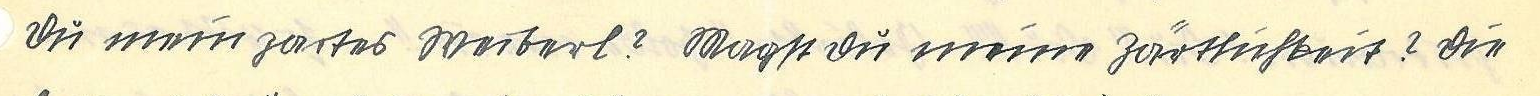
Du mein zartes Weiberl? Magst Du meine Zärtlichkeit? Die
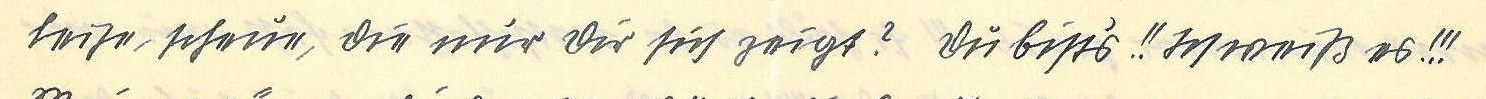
leise, scheue, die nur Dich sich zeigt? Du bist’s!! Ich weiß es!!!
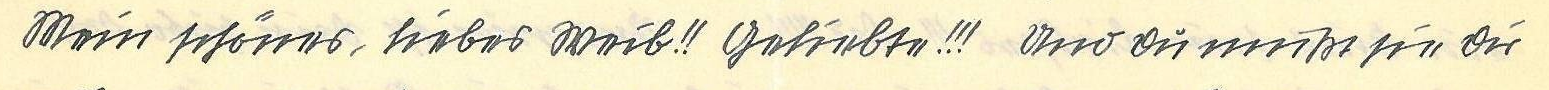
Mein schönes, liebes Weib!! Geliebte!!! Und Du mußt sie Dir
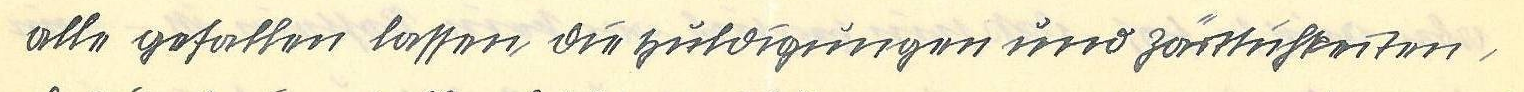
alle gefallen lassen, die Huldigungen und Zärtlichkeiten,
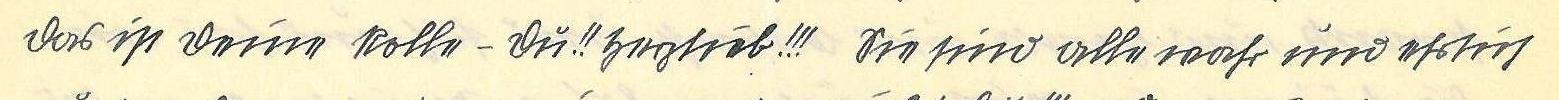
das ist Deine Rolle – Du!! Herzlieb!!! Sie sind alle wahr und ehrlich
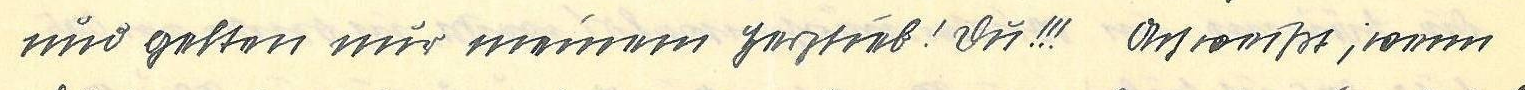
und gelten nur meinem Herzlieb! Du!!! Ach weißt; wenn
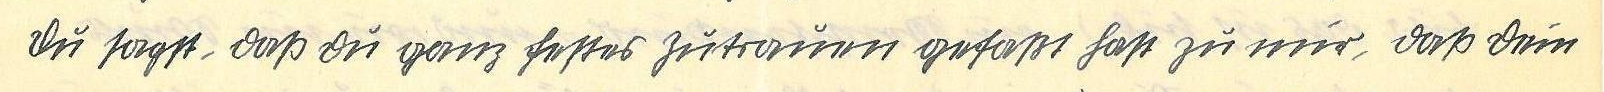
Du sagst, daß Du ganz festes Zutrauen gefaßt hast zu mir, daß Dein
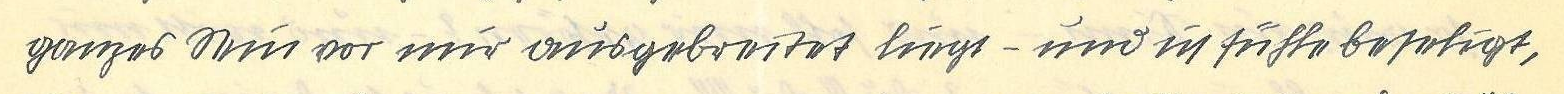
ganzes Sein vor mir ausgebreitet liegt – und ich fühle beseligt,
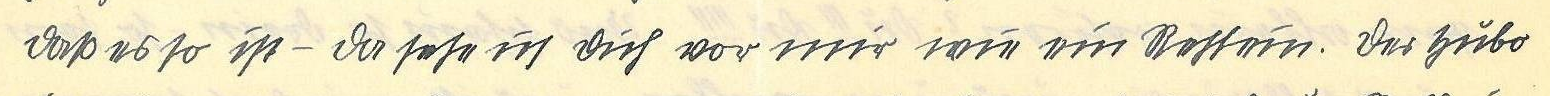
daß es so ist – da sehe ich Dich vor mir wie ein Rehlein. Der Hubo
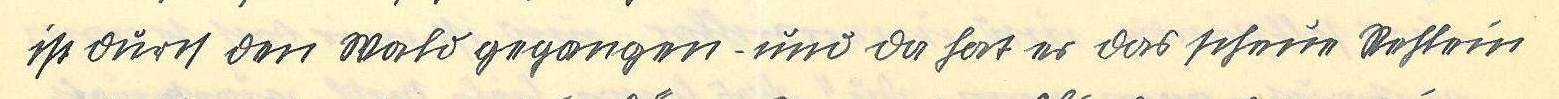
ist durch den Wald gegangen – und da hat er das scheue Rehlein
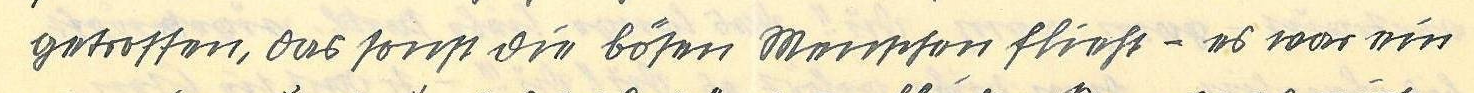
getroffen, das sonst die bösen Menschen flieht – es war ein
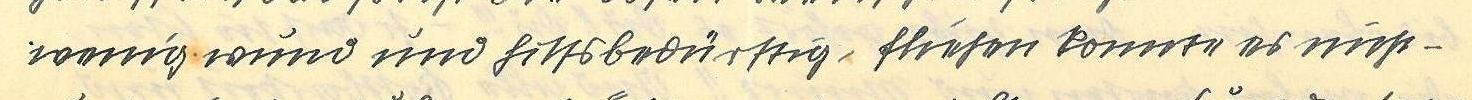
wenig wund und hilfsbedürftig, fliehen konnte es nicht –
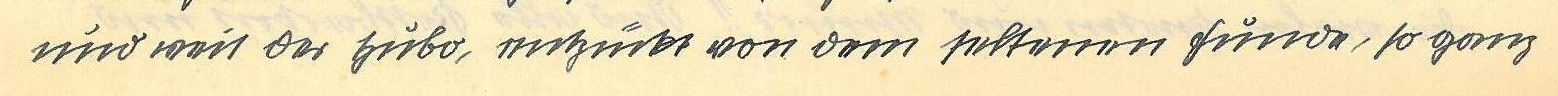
und weil der Hubo, entzückt von dem seltenen Funde, so ganz
